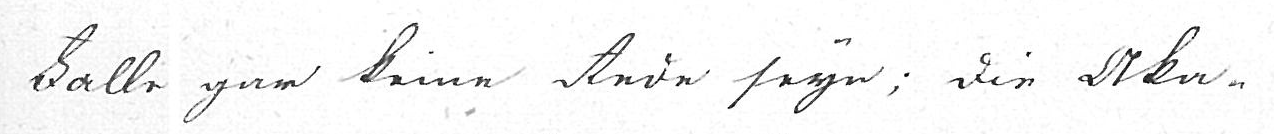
Falle gar keine Rede seyn; die Aka-
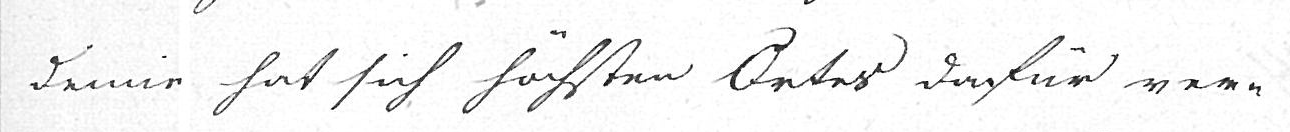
demie hat sich höchsten Ortes dafür ver-
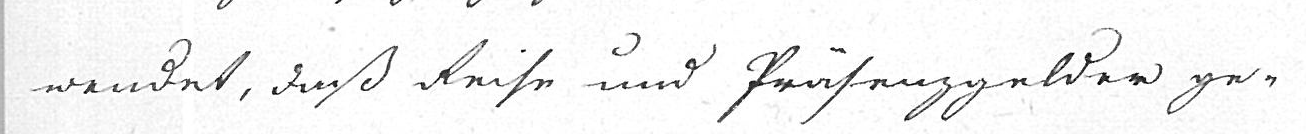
wendet, daß Reise und Präsenzgelder ge-
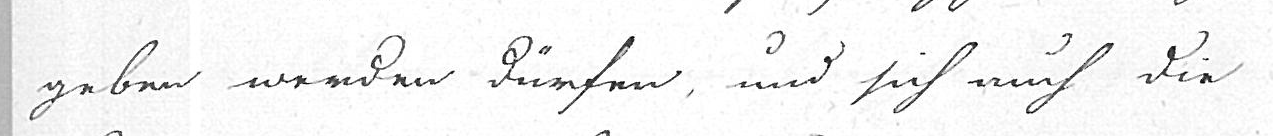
geben werden dürfen, und sich auch die
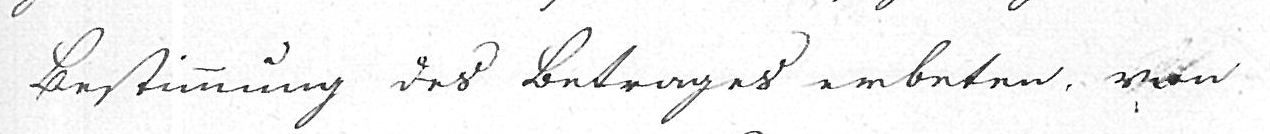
Bestimmgung des Betrages erbeten, von
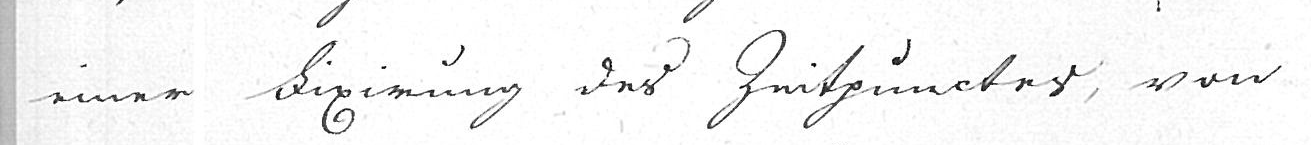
einer Fixirung des Zeitpunctes, von
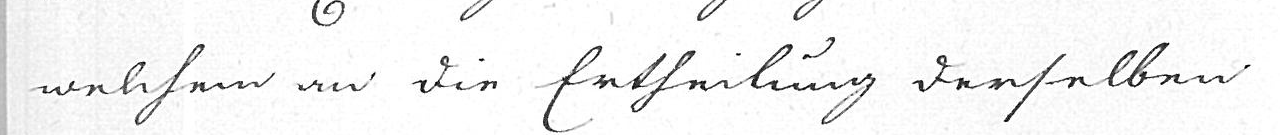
welchem an die Ertheilung derselben
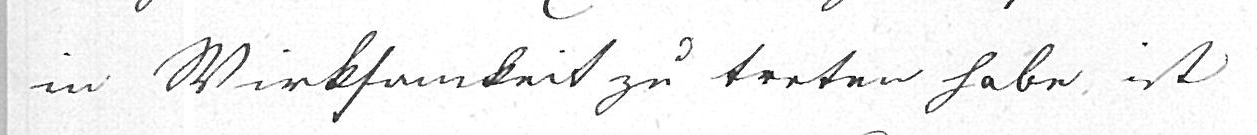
in Wirksamkeit zu treten habe, ist
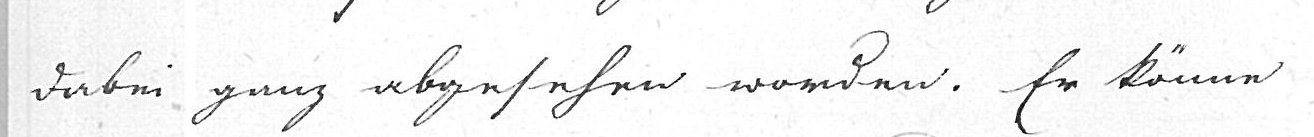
dabei ganz abgesehen worden. Er könne
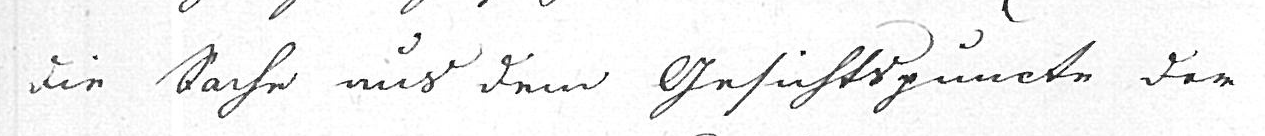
die Sache aus dem Gesichtspuncte der
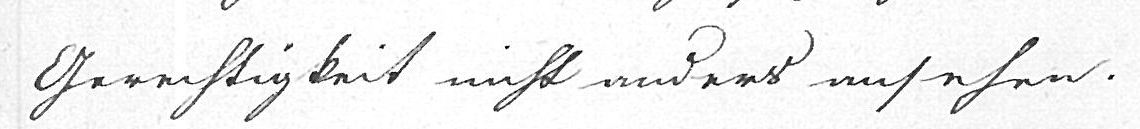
Gerechtigkeit nicht anders ansehen.
